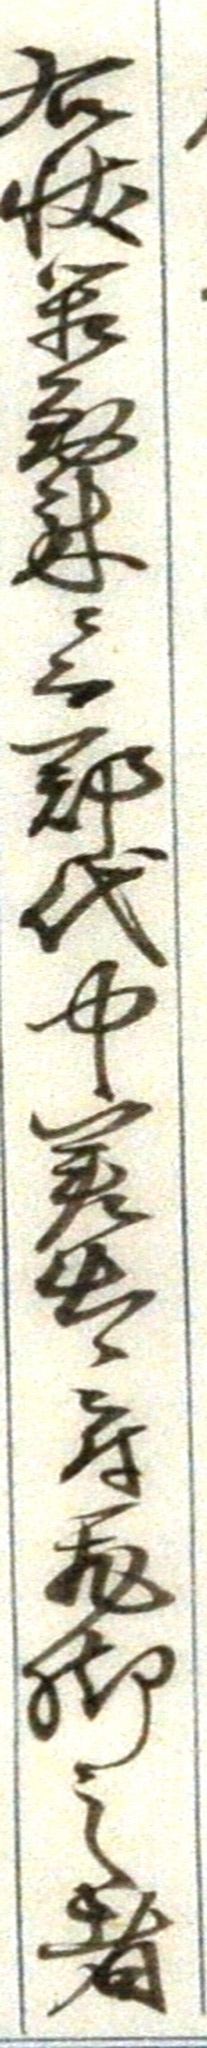右状箱到来ニ而郡代中差出候ニ付飛脚之者
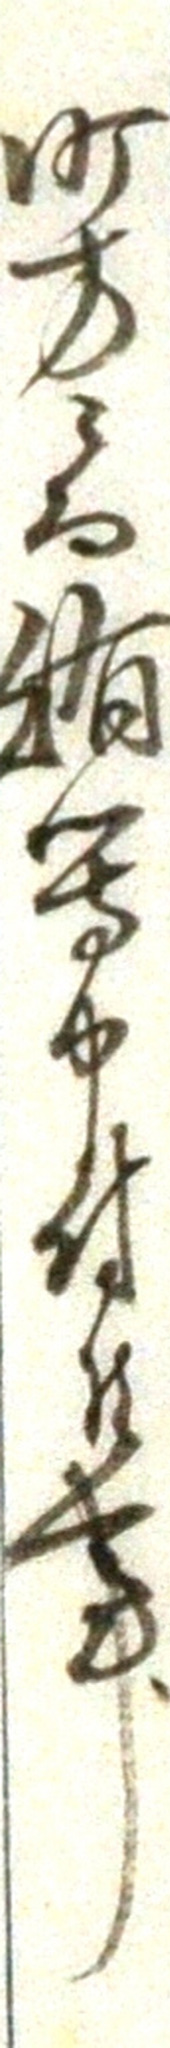町方ニ而賄等申付候事
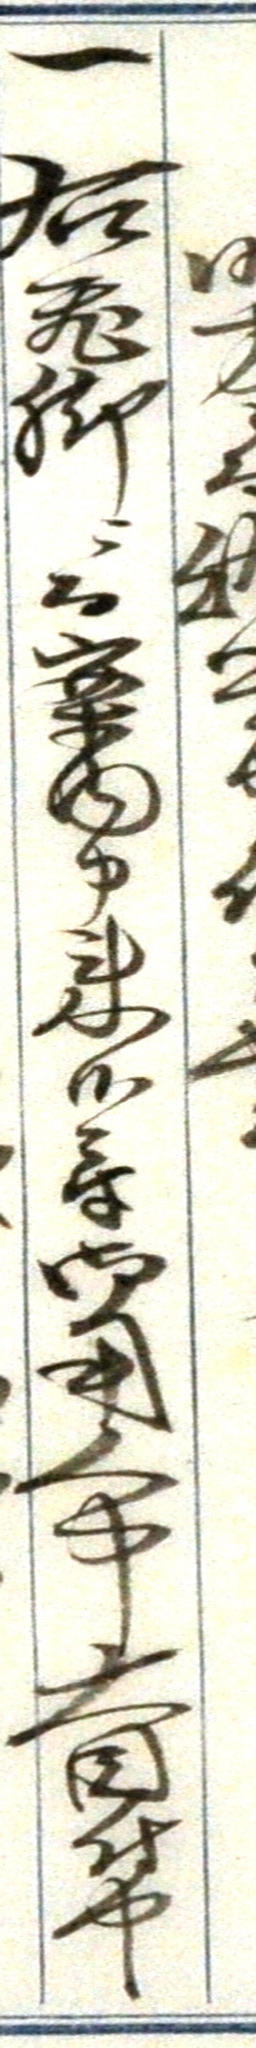一右飛脚ニ而案内申来候ニ付御用人中大目付中
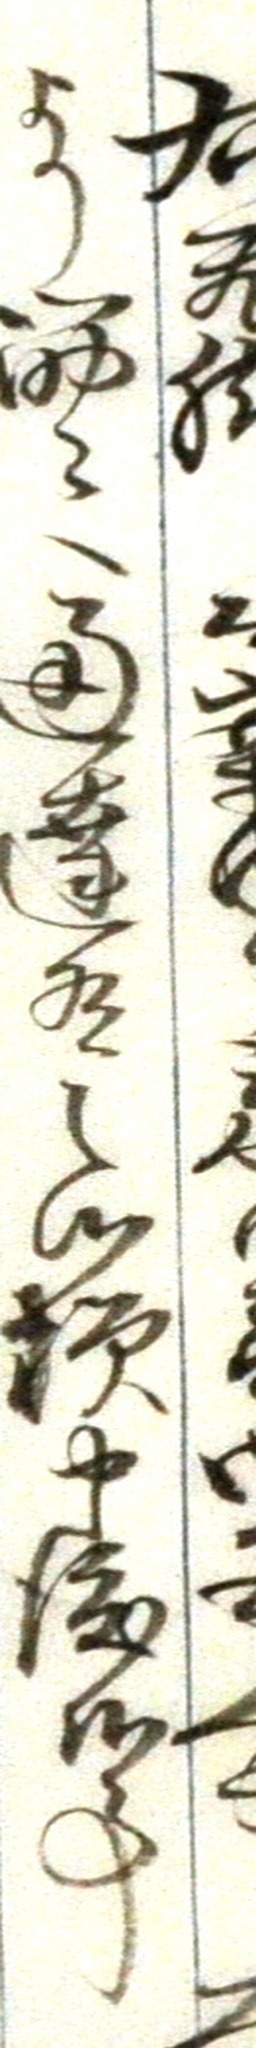より筋々へ通達有之候様申渡候事
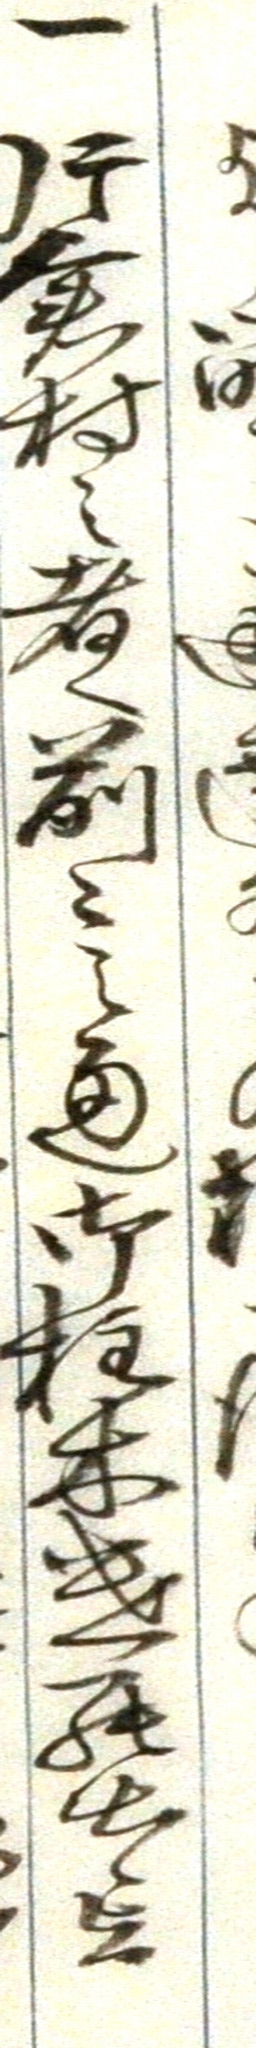一片倉村之者へ前々之通御柱木遣罷出候旨
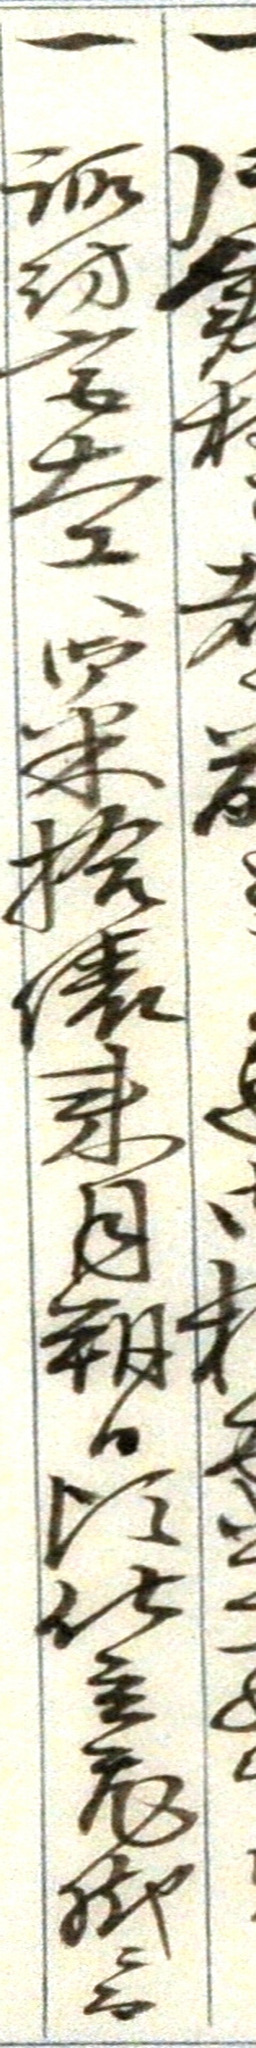一諏訪宮大工へ御米拾俵来月朔日頃仕立飛脚ニ而
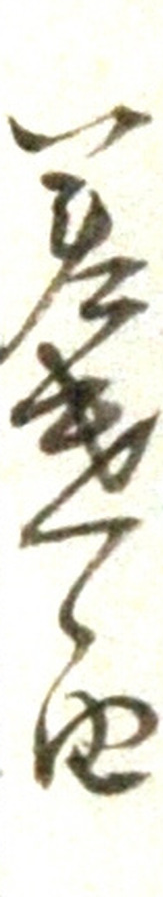差遣候由
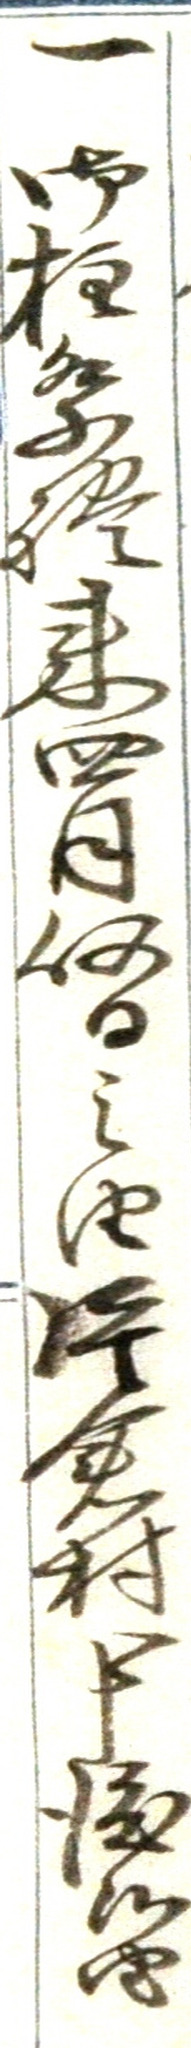一御柱祭礼来四月何日之由片倉村へ申渡候由

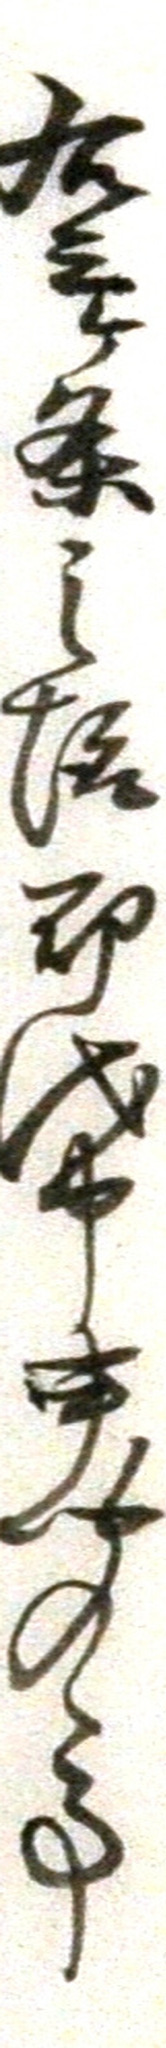右三ケ条之趣郡代中申聞候事
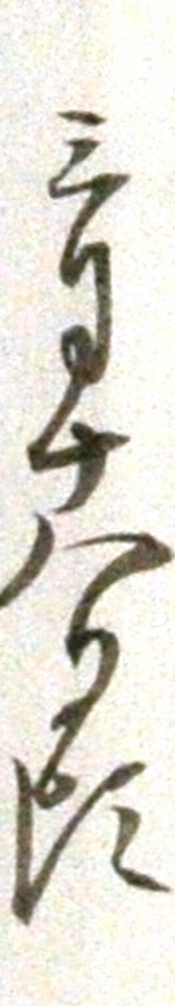三月十八日頃
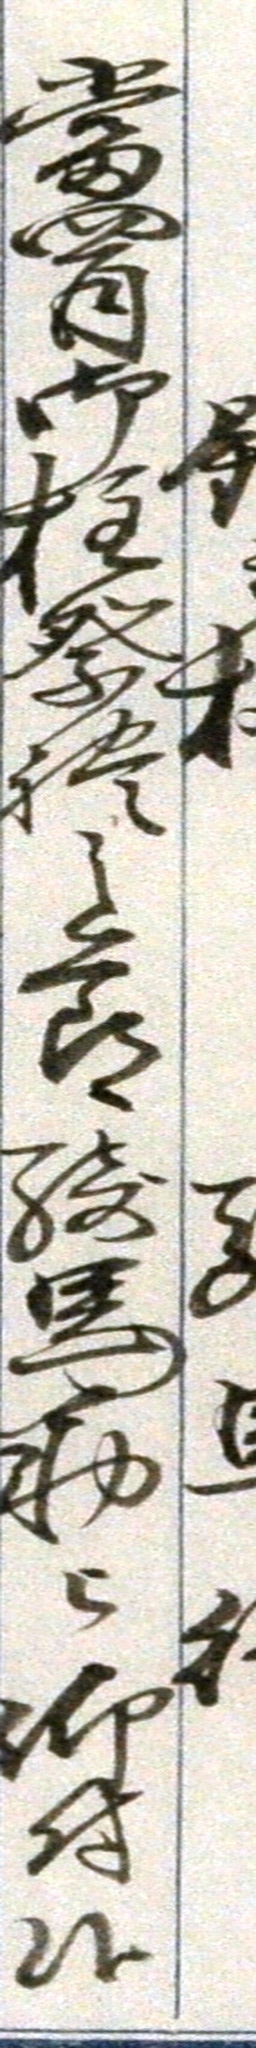当四月御柱祭礼之節騎馬勤被仰付候
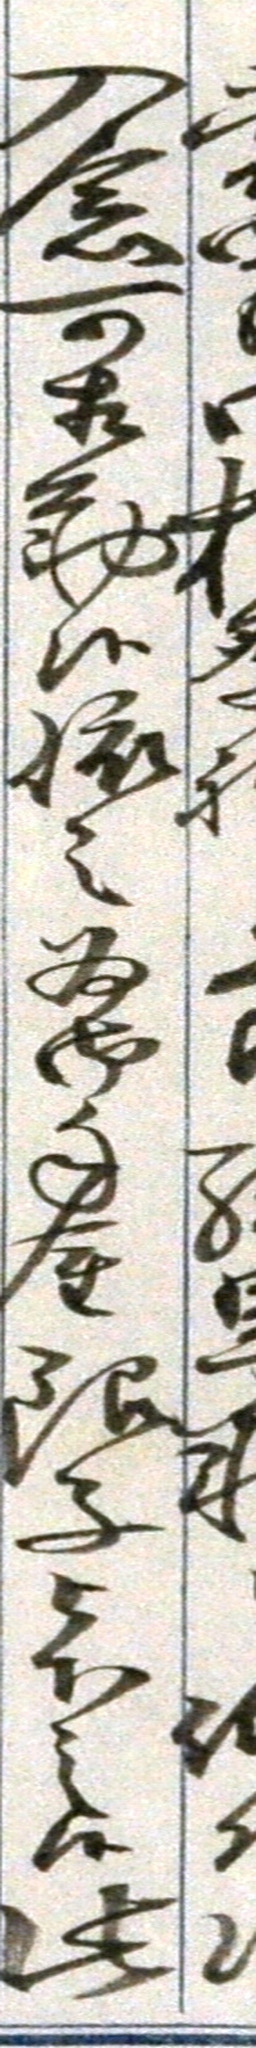入念可相勤候依之為御手金銀子被下之候此
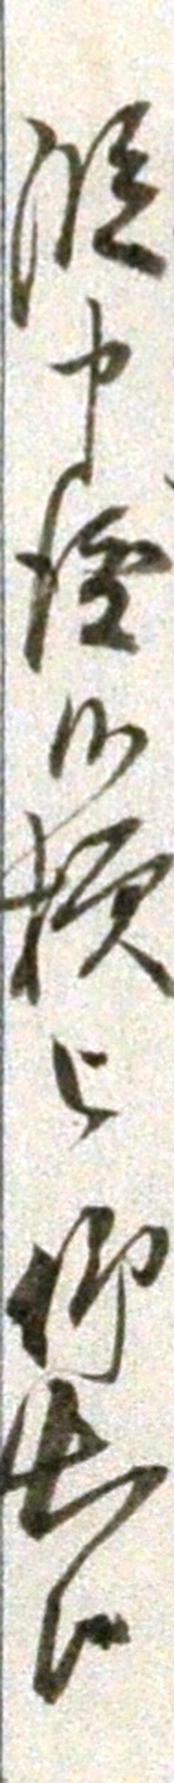段申渡候様被仰出候
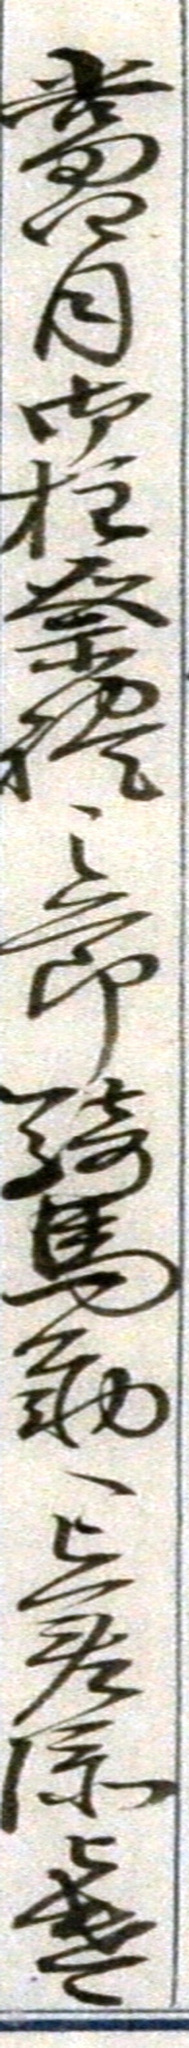当四月御柱祭礼之節騎馬勤へ被差添被遣候
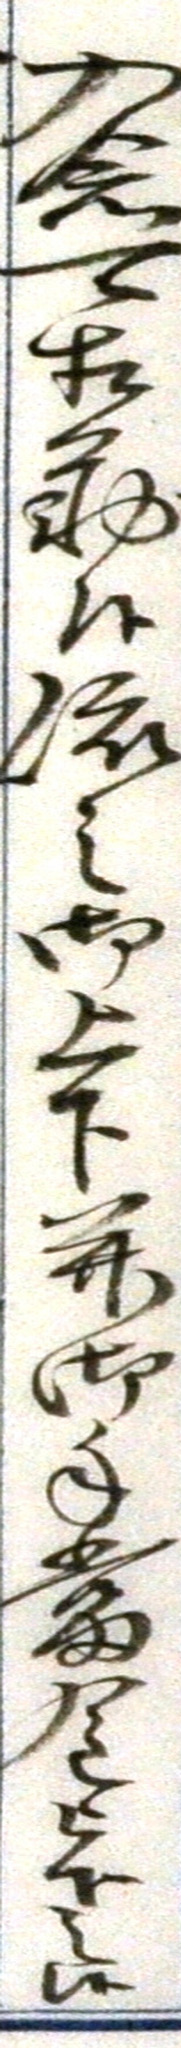入念可相勤候依之御上下并御手当金被下之候
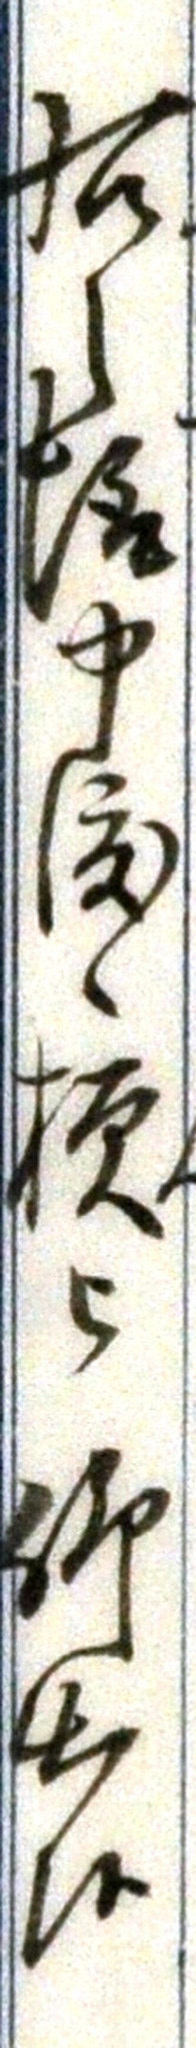右之趣申渡候様被仰出候
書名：諏訪御柱祭之節・騎馬大将御中間頭・御柱引人足
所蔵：伊那市立高遠町図書館・合同会社AMANE
